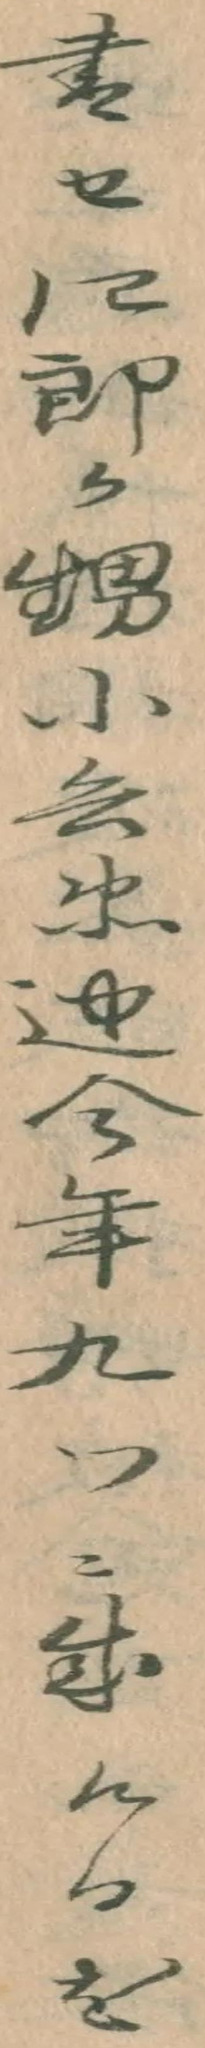書せ四郎か甥小兵衛迚今年九つに成けるを
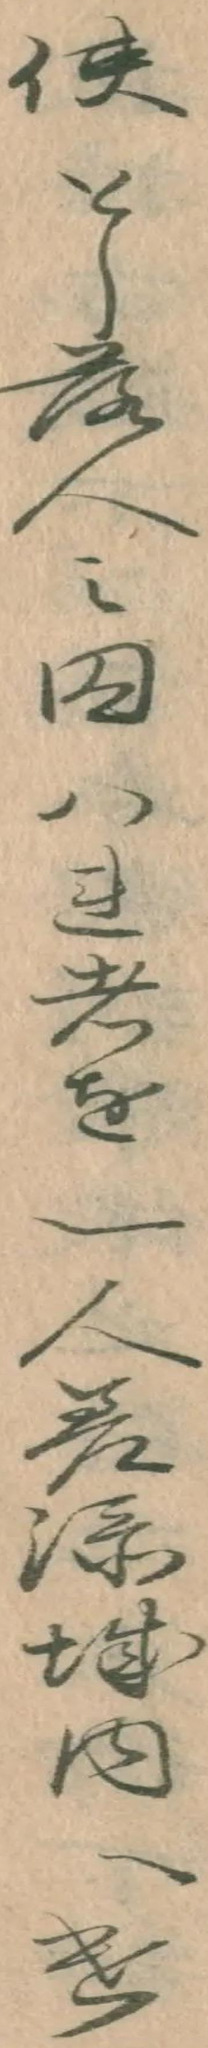使とし落人之囚は連者を一人差添城内へ遣
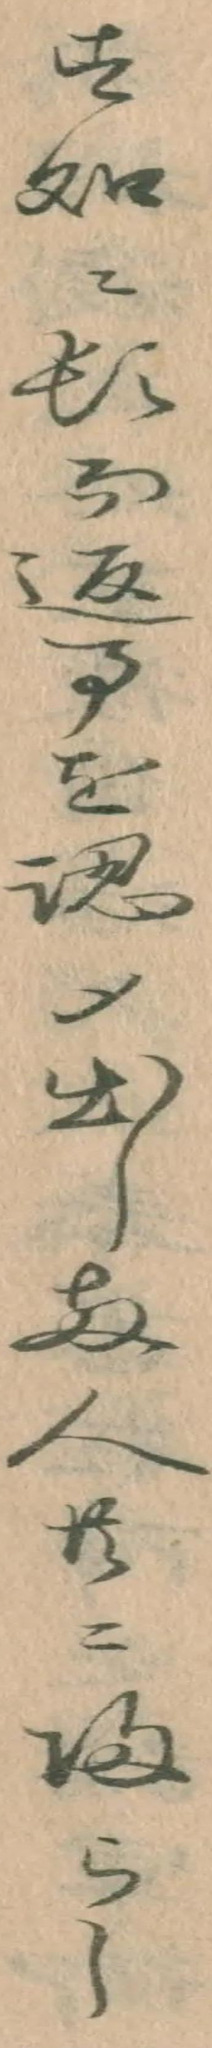春如に頓而返事を認め出し両人共に帰らし
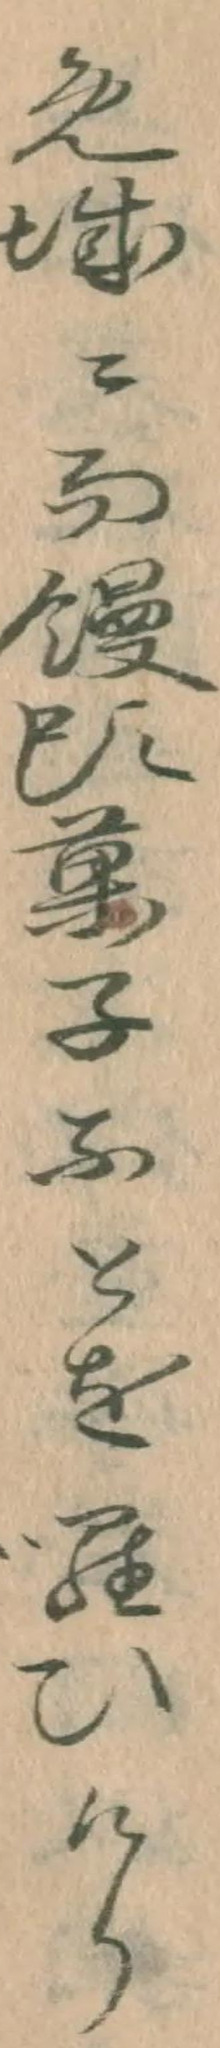免城に而饅頭菓子なとを囉ひけり
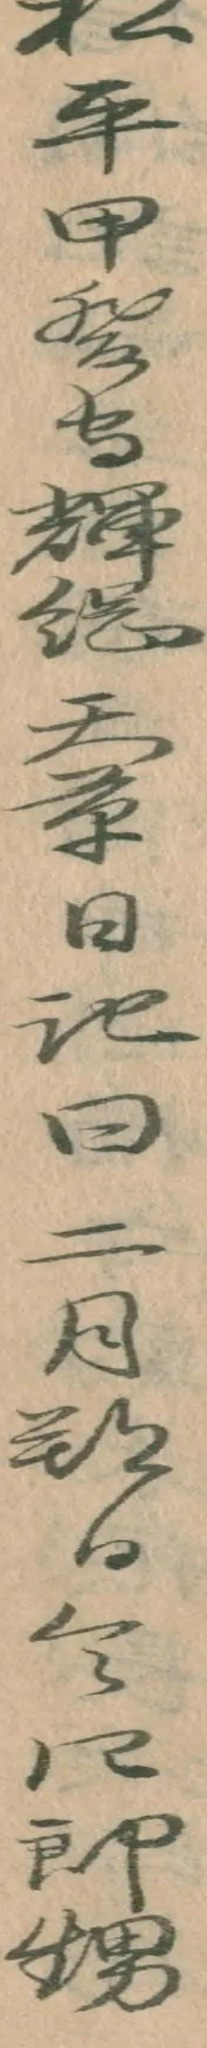松平甲斐守輝綱天草日記曰二月朔日令四郎甥
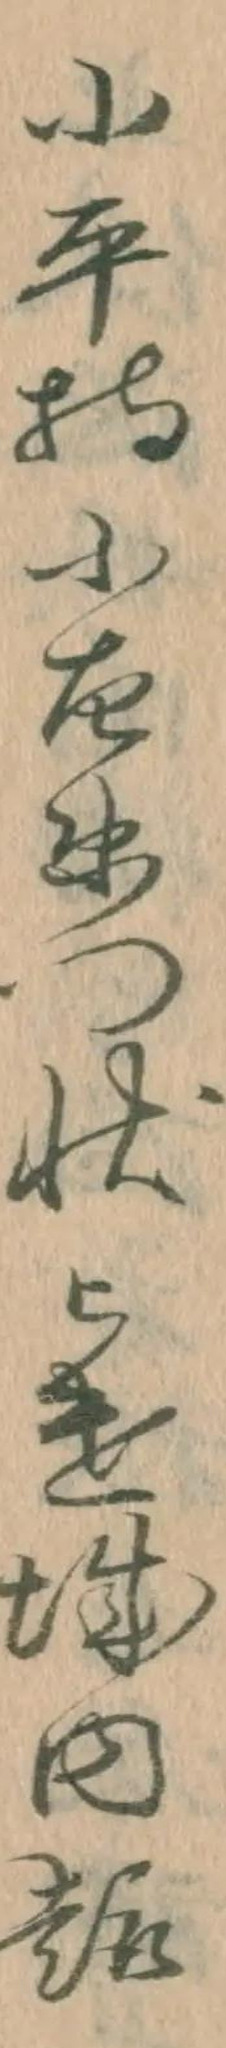小平持小左衛門状被遣城内趣
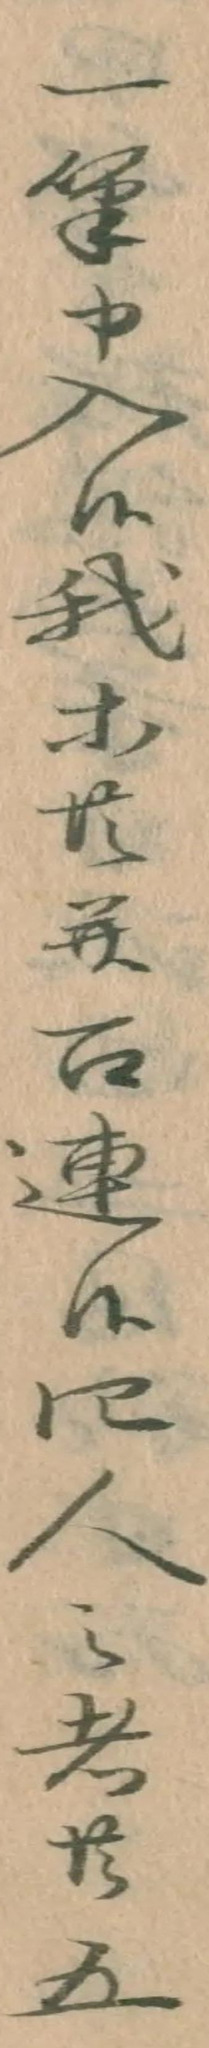一筆申入候我等共幷召連候四人之者共五
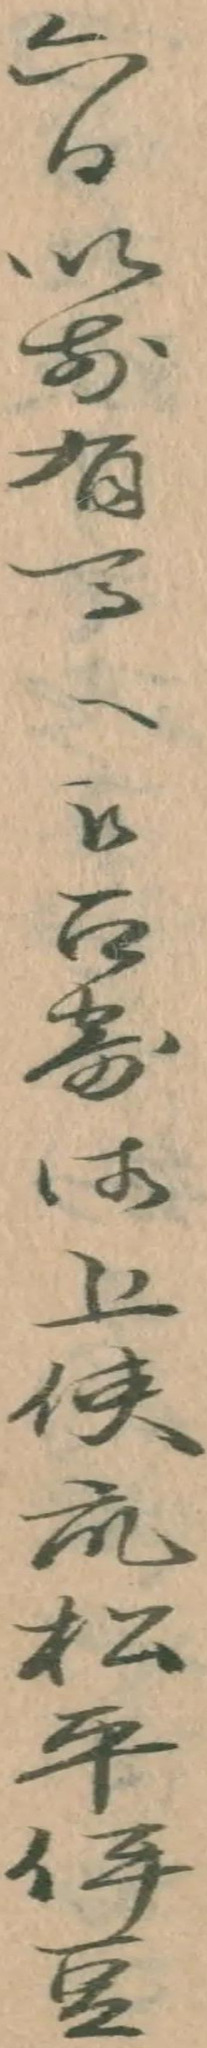六日以前有馬へ被召寄御上使衆松平伊豆
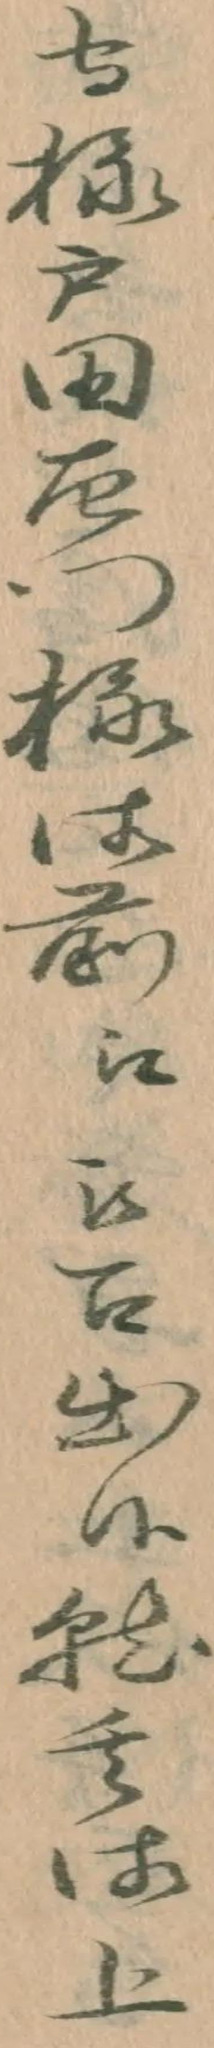守様戸田左門様御前江被召出候就其御上
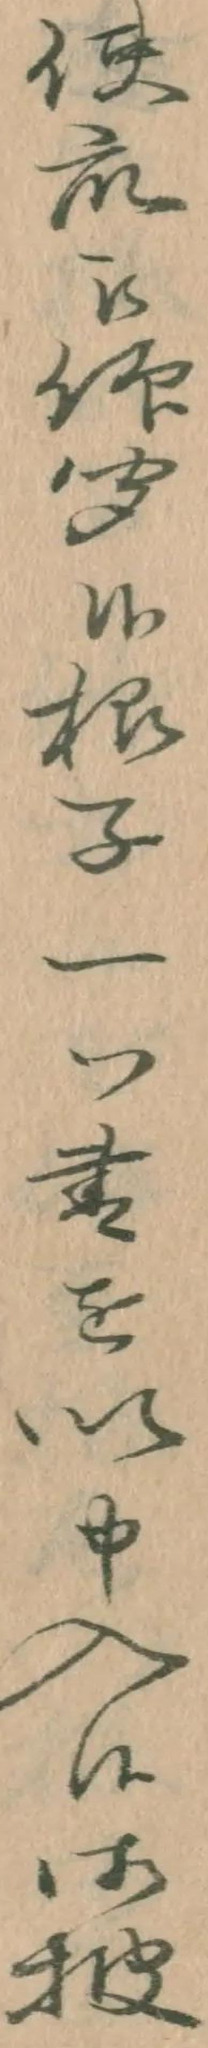使衆被仰聞候様子一つ書を以申入候御披
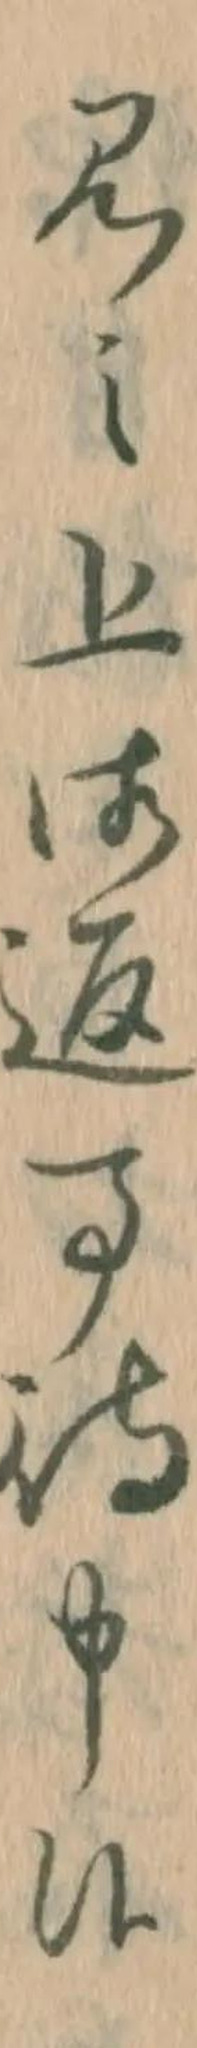見之上御返事待申候
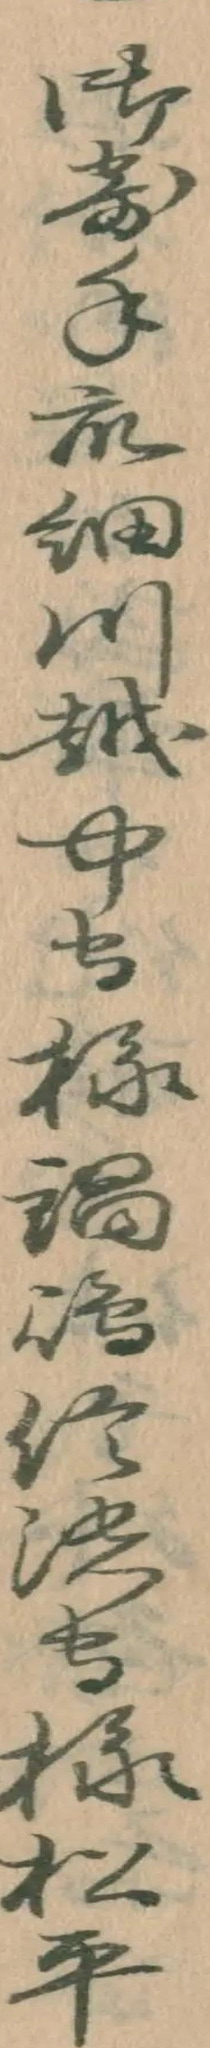一御寄手衆細川越中守様鍋島信濃守様松平
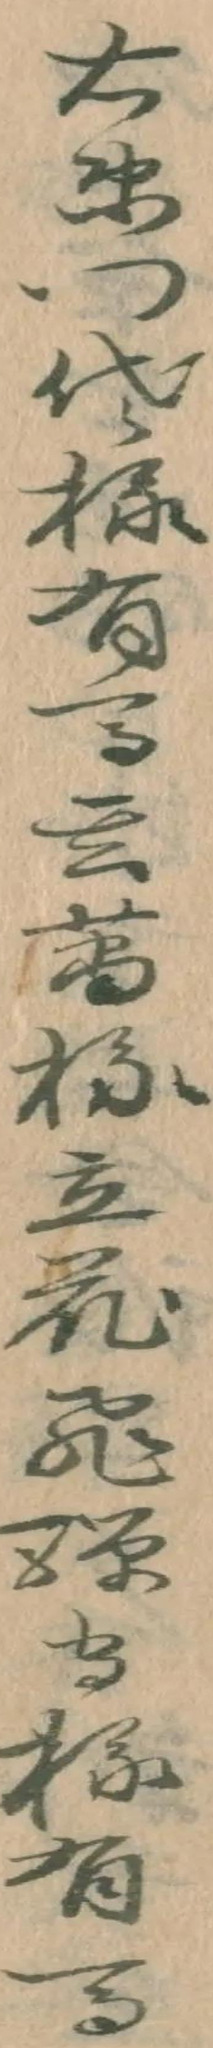右衛門佐様有馬玄蕃様立花飛騨守様有馬
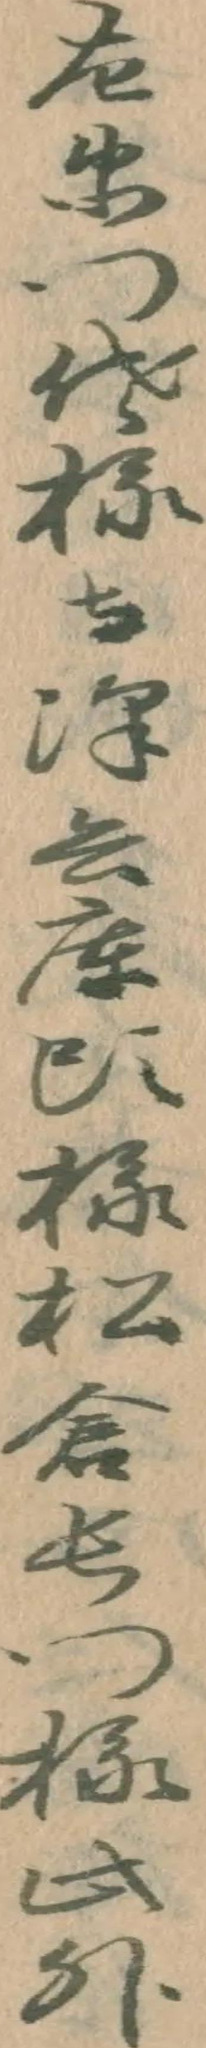左衛門佐様寺沢兵庫頭様六倉長門様此外
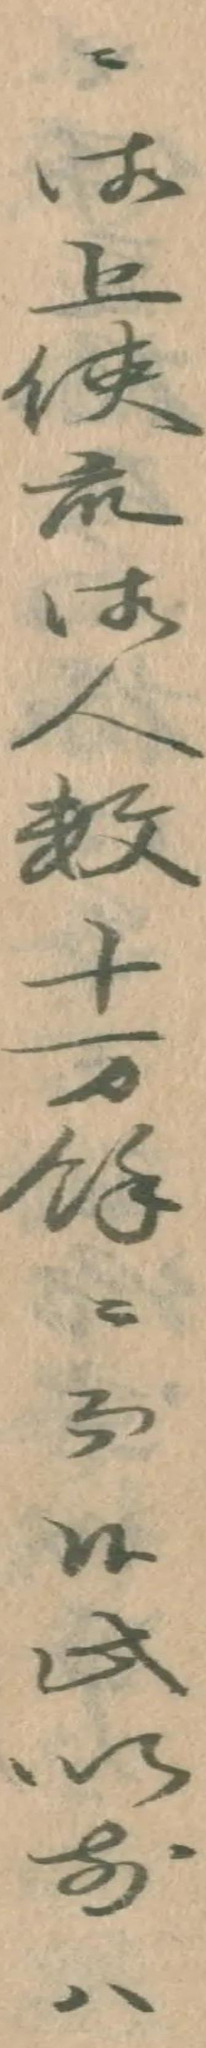に御上使衆御人数十万余に而候此以前は
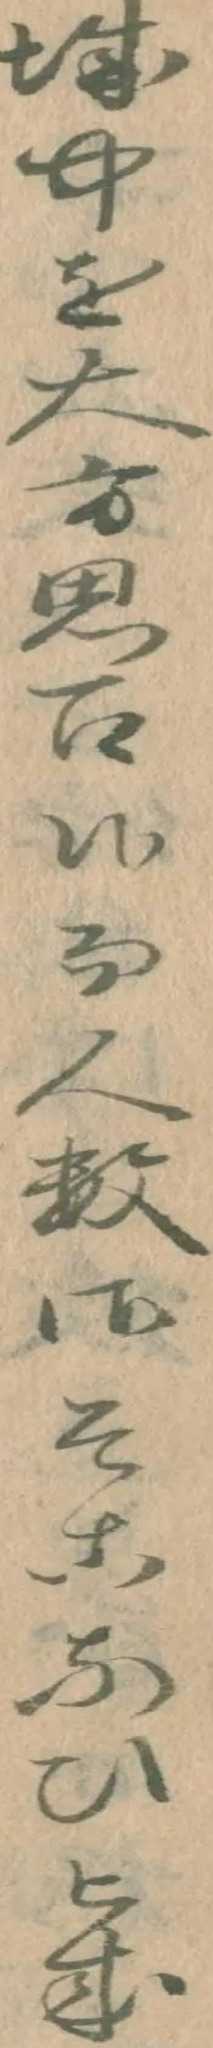城中を大方思召候而人数御そ古なひ被成
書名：切支丹御退治記 49巻. [6]
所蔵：国立国会図書館 National Diet Library, JAPAN
